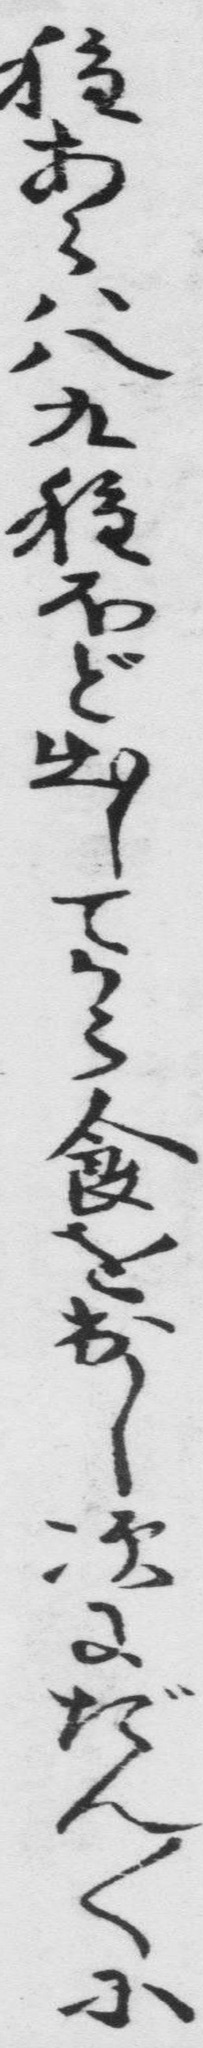種あらは八九種不ど出してから食を出し次尓だん〳〵尓
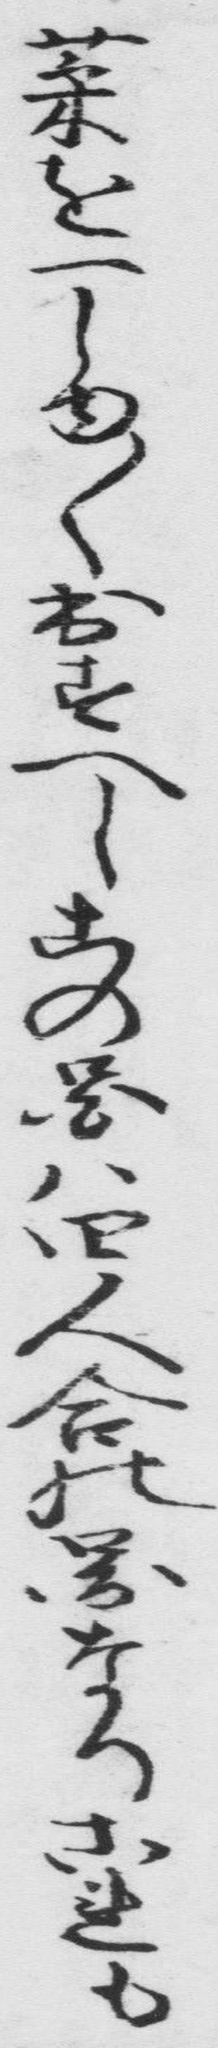菜を一しゆ〳〵出春へし古の図は四人合能図なり古連も
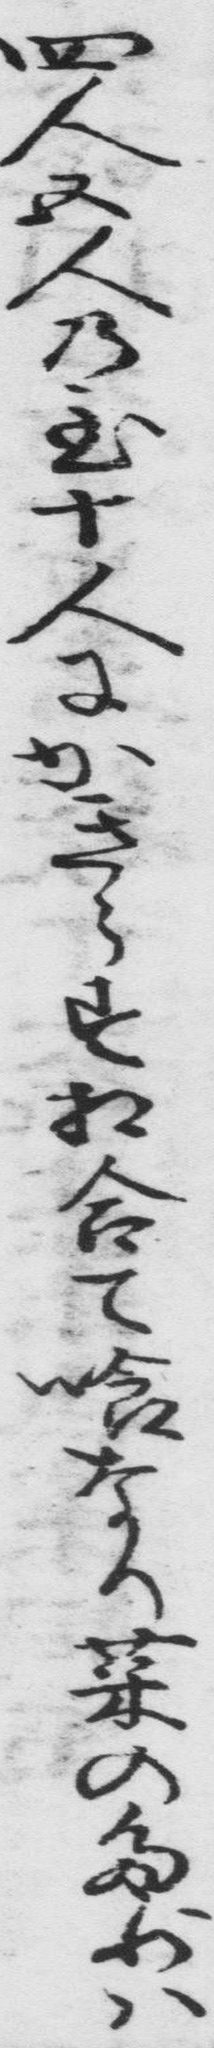四人五人乃至十人尓かきら春相合て喰なり菜の多少は
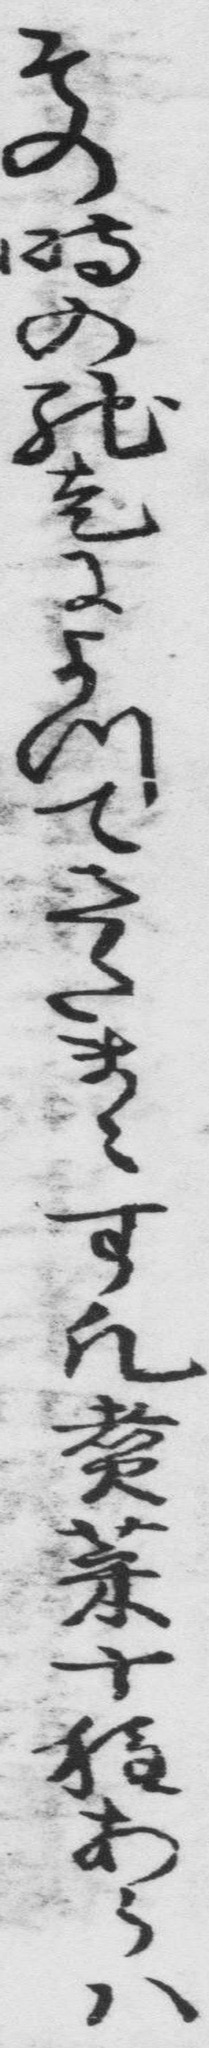その時の馳走尓よ川てさたまゝす凡煮菜十種あらは
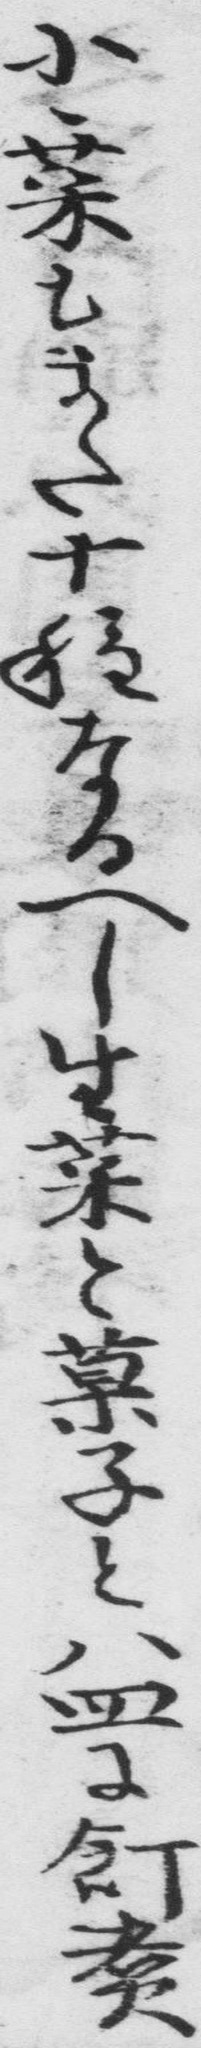小菜もまた十種なるへし生菜と菓子とは皿尓飣煮
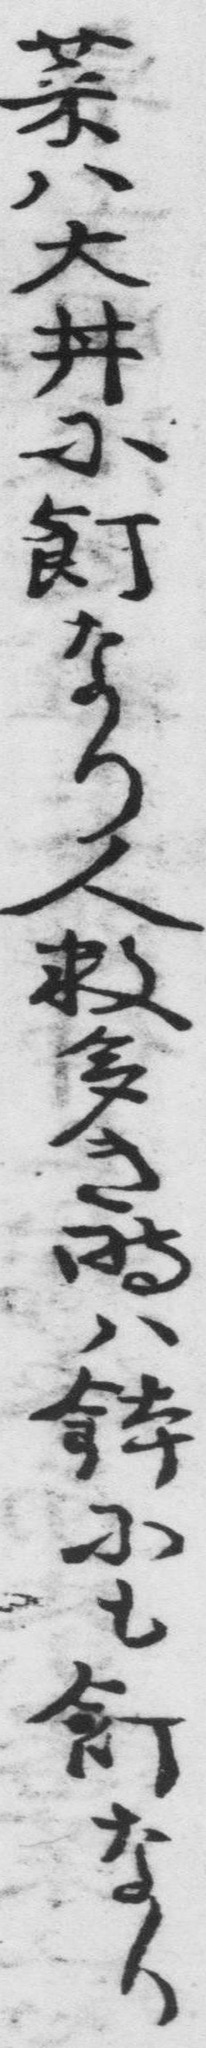菜は大井尓飣なり人数多き時は鉢尓も飣なり

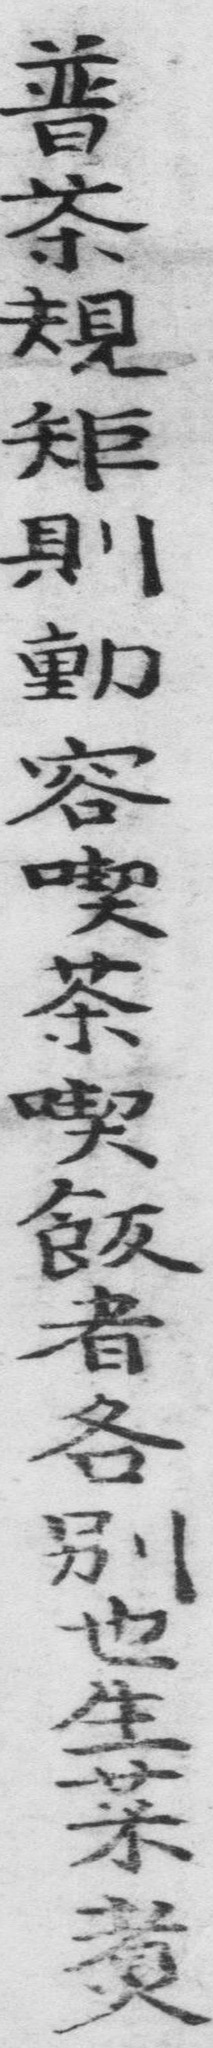普茶規矩則動容喫茶喫飯者各別也生茶煮
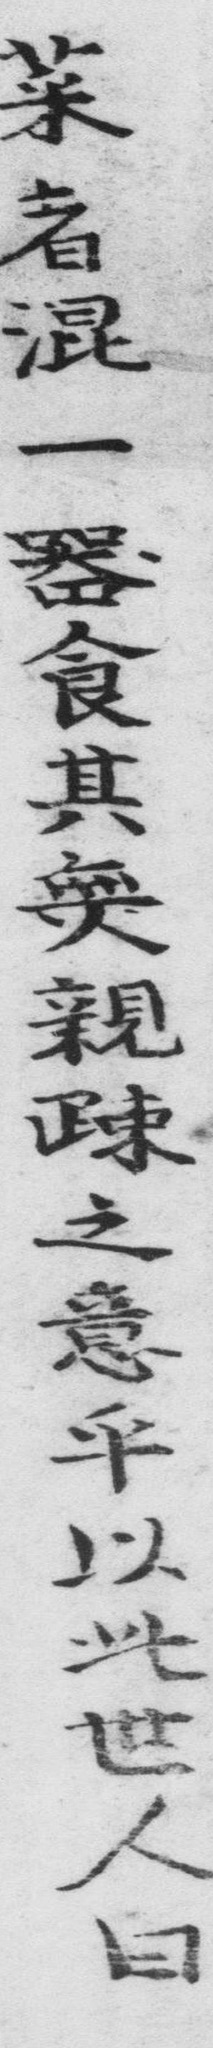菜者混一器食其無親疎之意乎以此世人曰
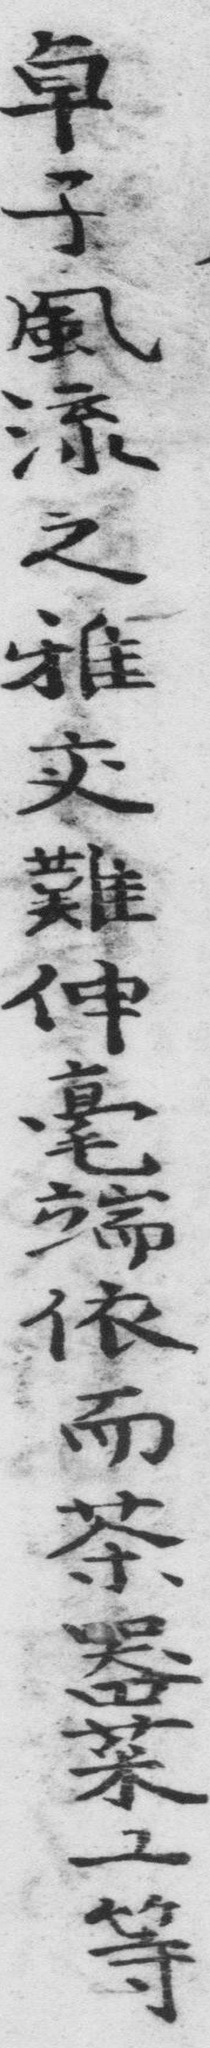卓子風流之雅交難伸毫端依而茶器菜工等
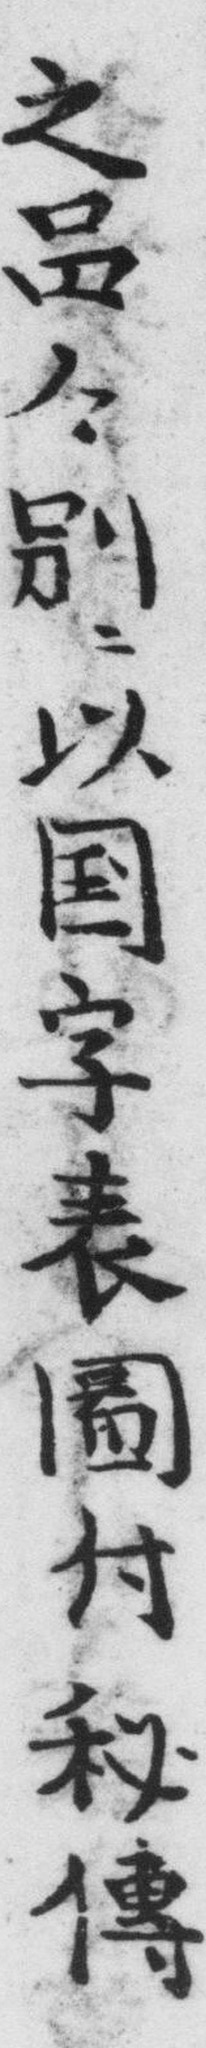之品々別に以国字表図付秘傳
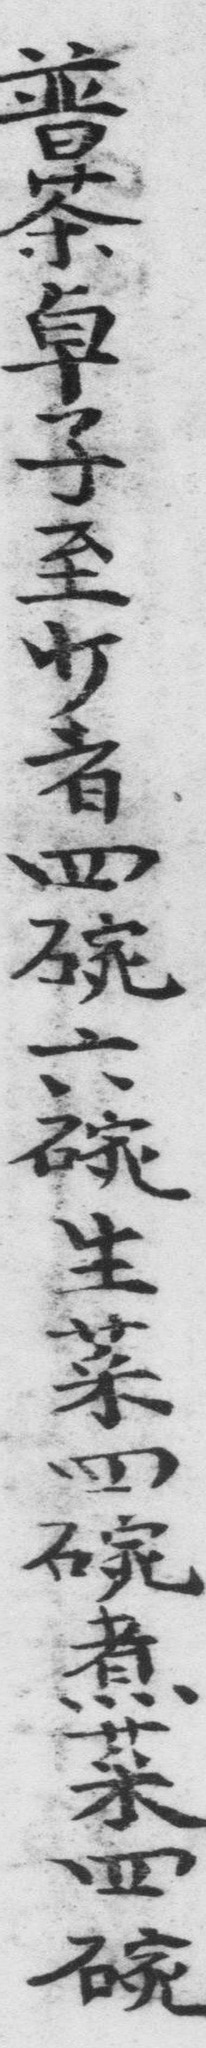普茶卓子至少者四碗六碗生菜四碗煮菜四碗
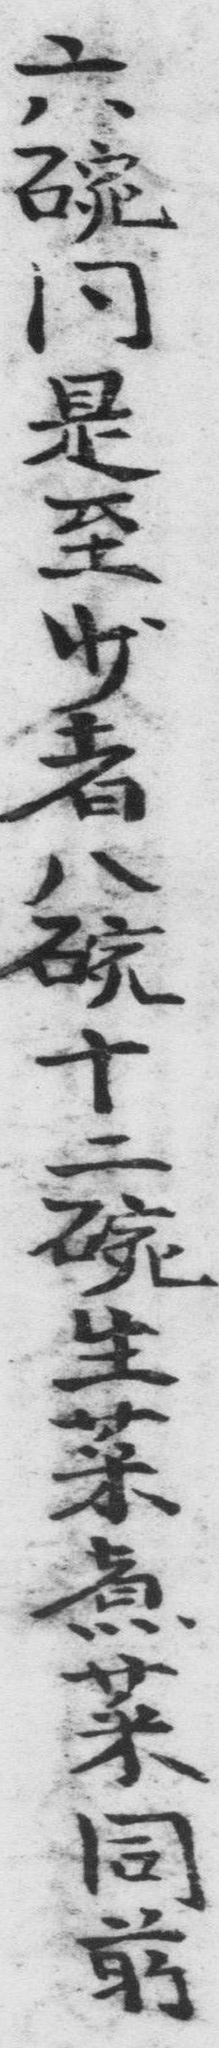六碗門是至少者八碗十二碗生菜煮菜同所
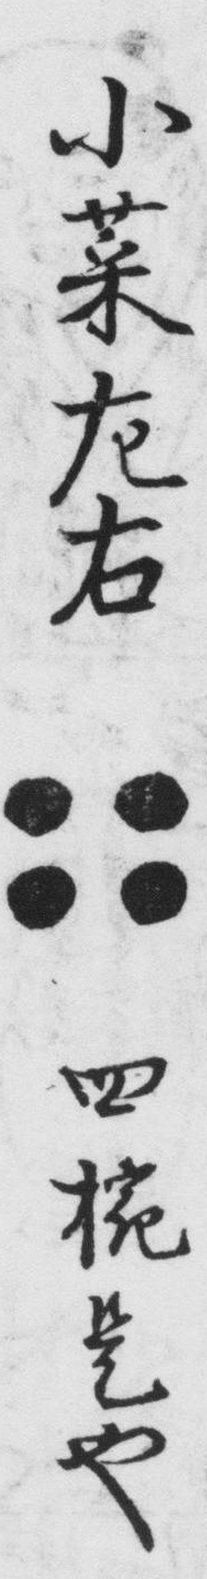小菜左右四椀是也
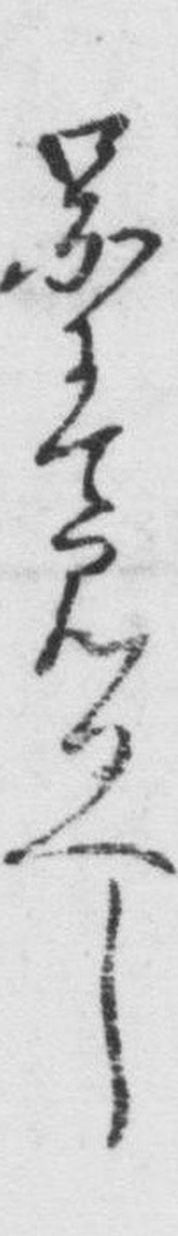図尓て見るへし
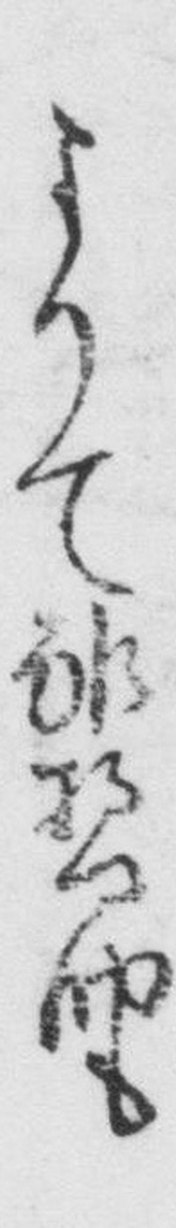よりて酢醤油も
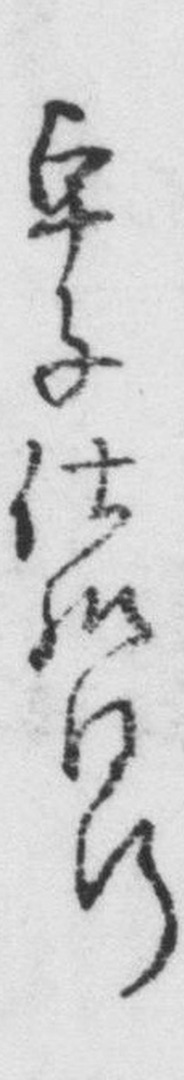卓子仕処同断
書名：普茶料理抄
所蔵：大阪府立大学学術情報センター 国文学研究資料館
